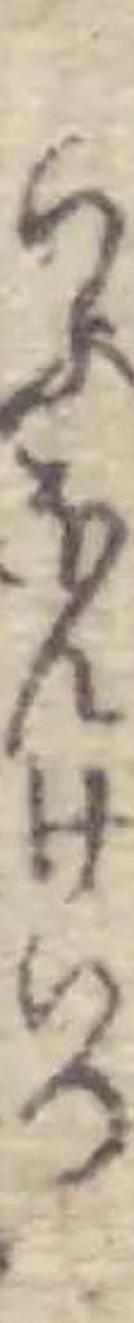いふほんけいつ
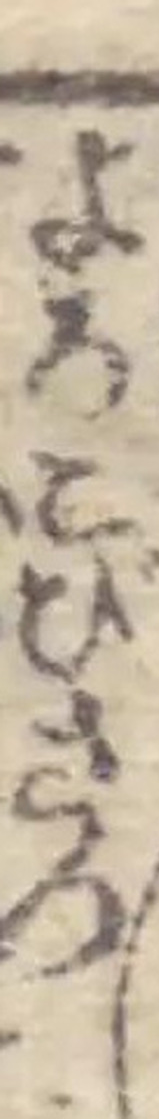よろこびさつ
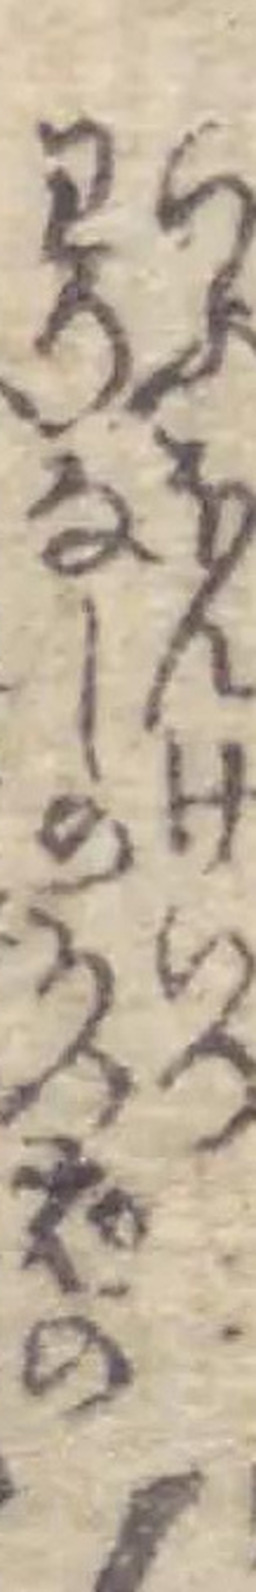わりなしのかつぱの
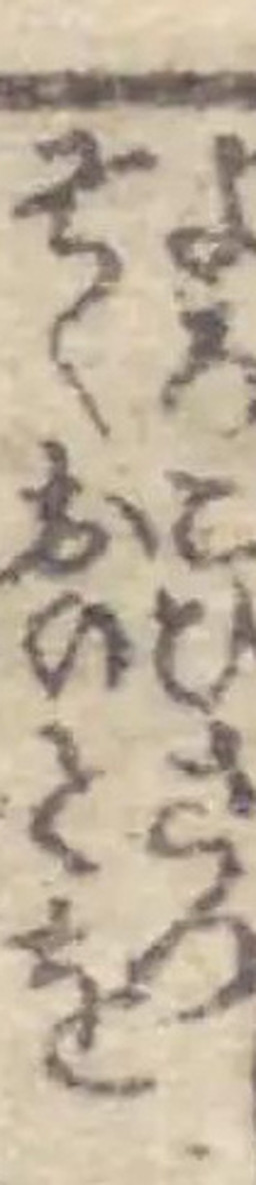そくおいとを
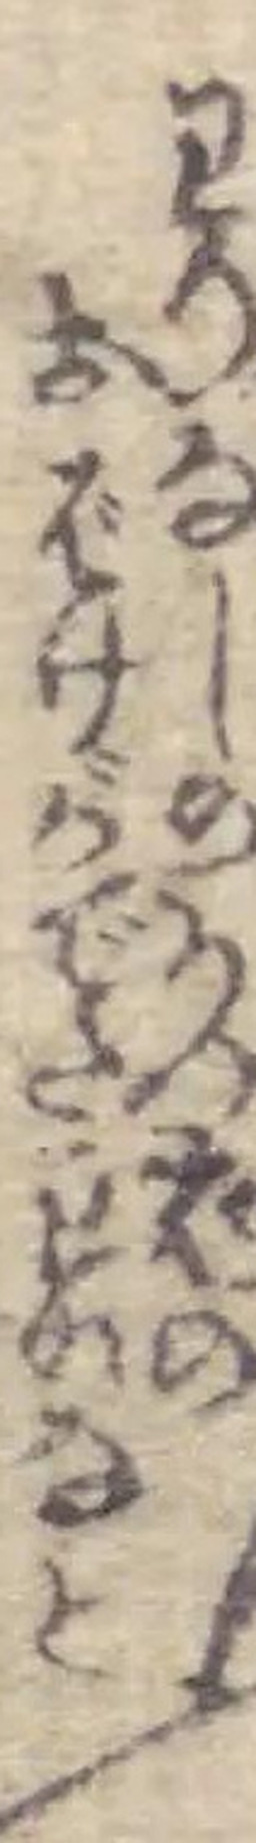おばけがでたわいなと
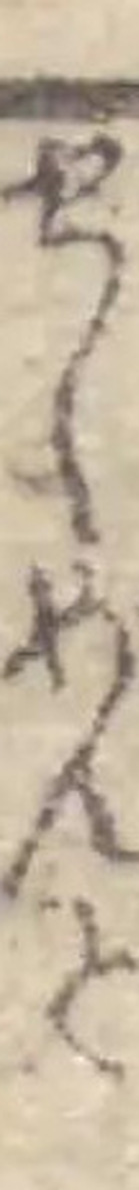せしめんと
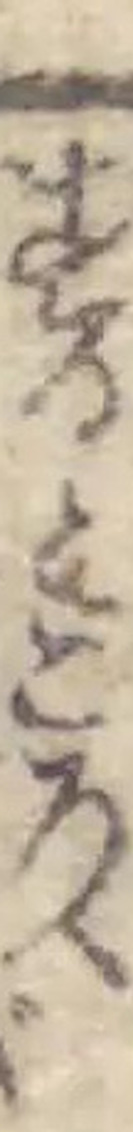するところへ
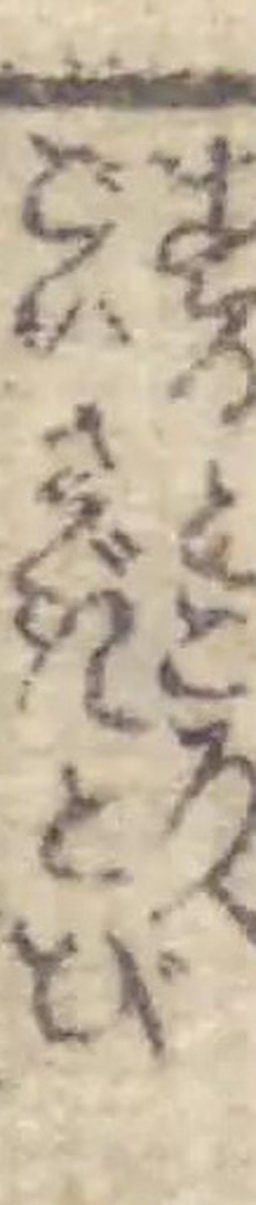ごいさぎとび
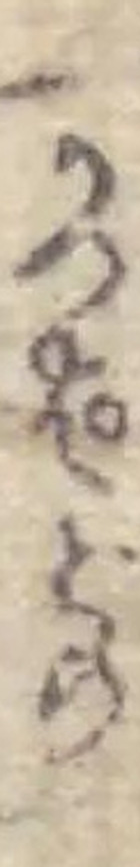かつぱどの
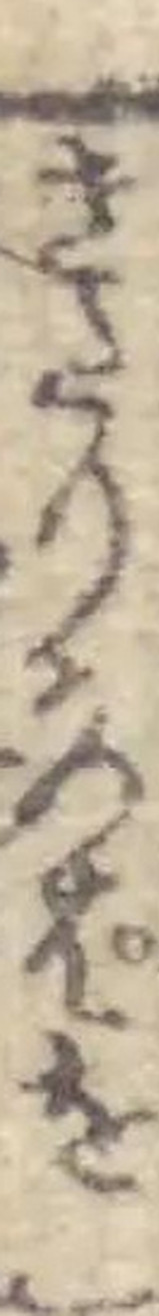きたりかつぱを
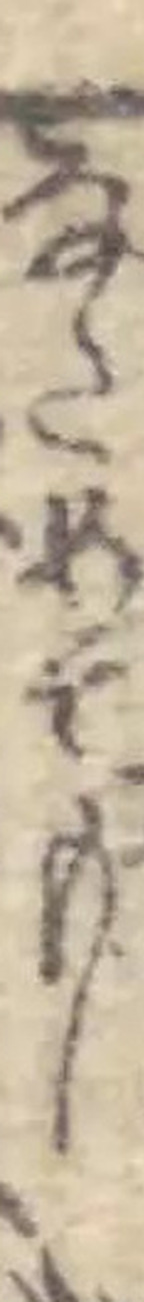なためてもゝ
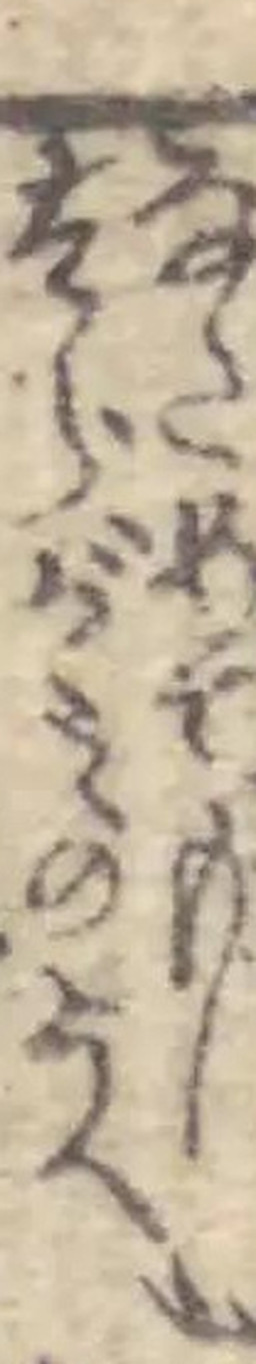太郎がみのうへ
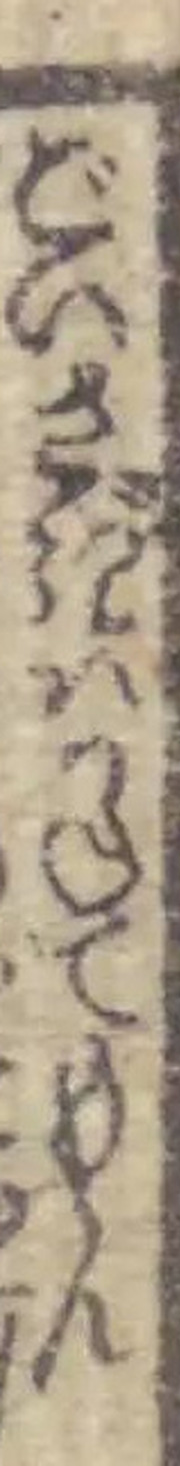ごいさぎはかねてもゝん
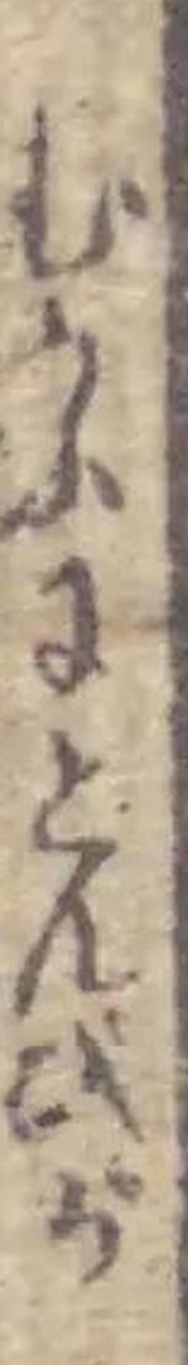むかふにとんびが
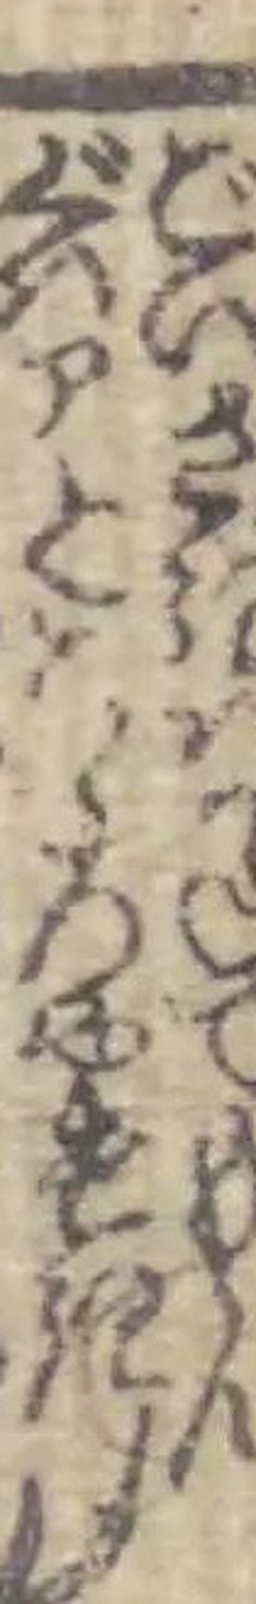ぐはァとこゝろやすき
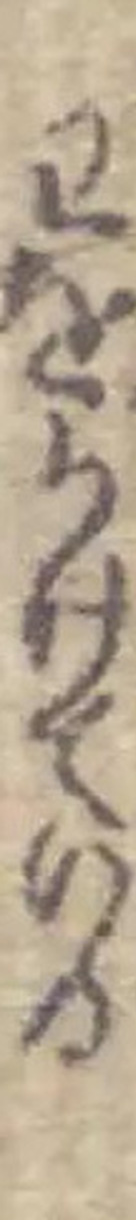わをかけている
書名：化物尽 4巻
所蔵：国立国会図書館 National Diet Library, JAPAN
